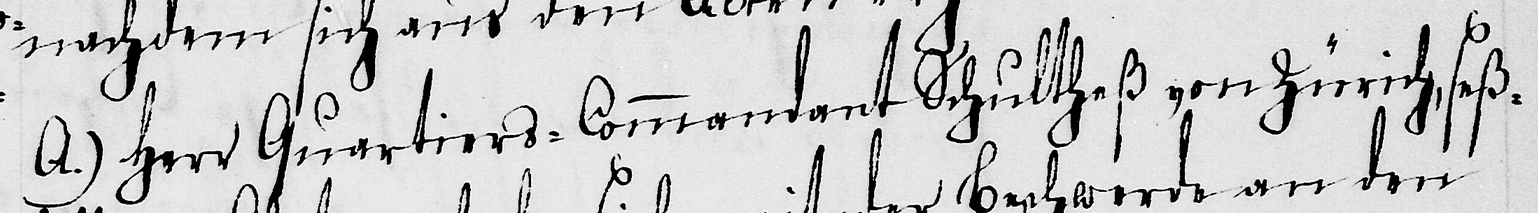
A.) Herr Quartiers-Commandant Schultheß von Zürich, seß¬
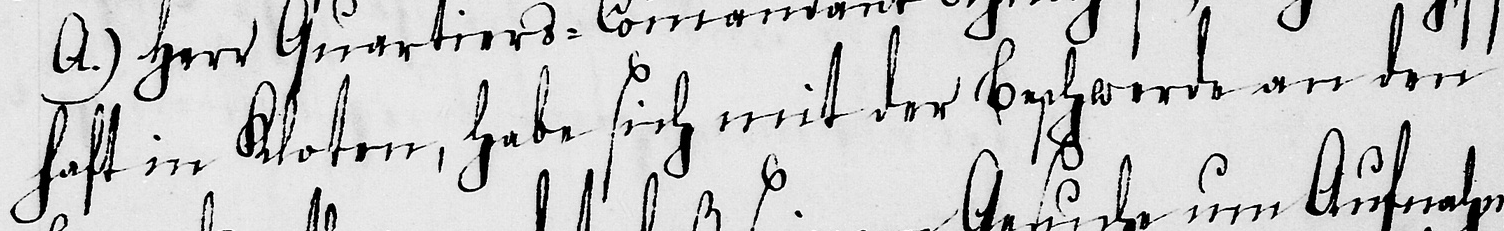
haft in Kloten, habe sich mit der Beschwerde an den
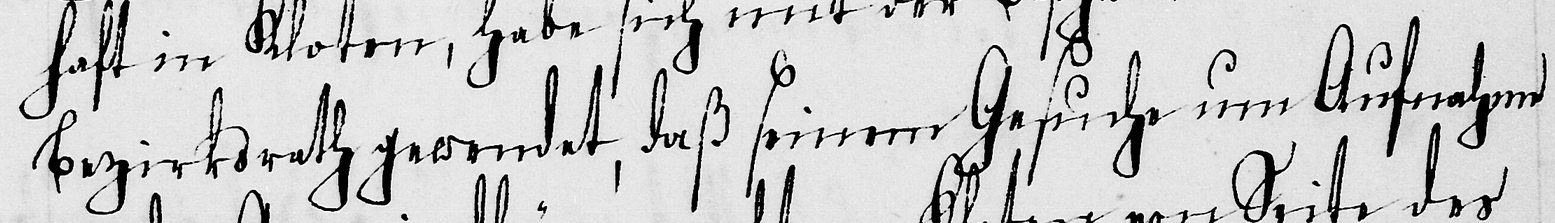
Bezirksrath gewendet, daß seinem Gesuche um Aufnahme
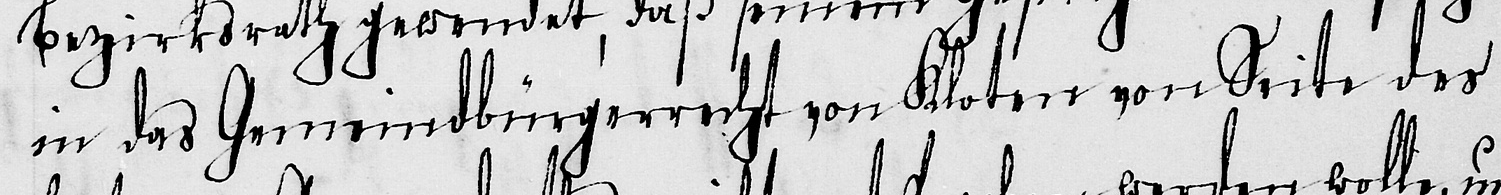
in das Gemeindbürgerrecht von Kloten von Seite des
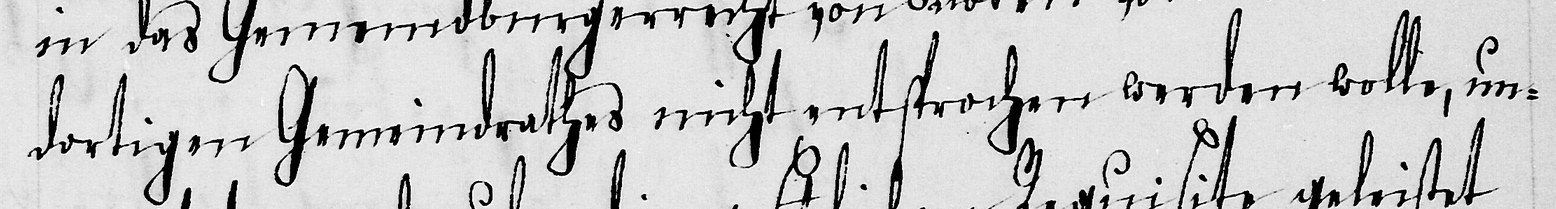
dortigen Gemeindrathes nicht entsprochen werden wolle, un¬
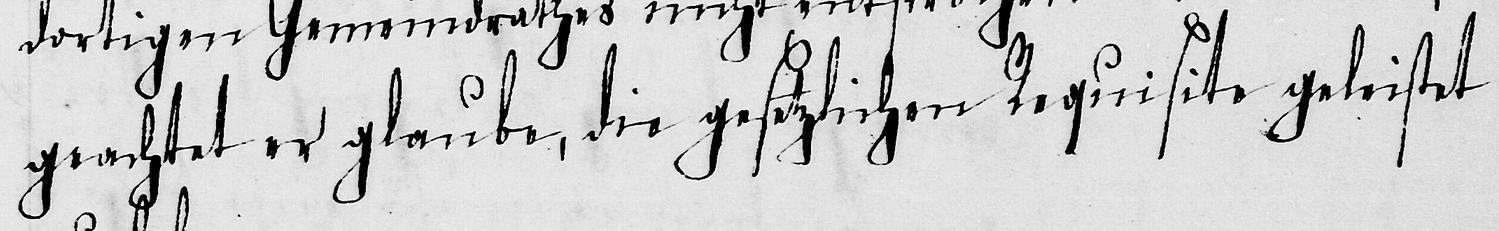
geachtet er glaube, die gesetzlichen Requisite geleistet
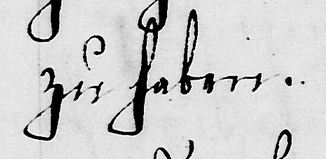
zu haben.
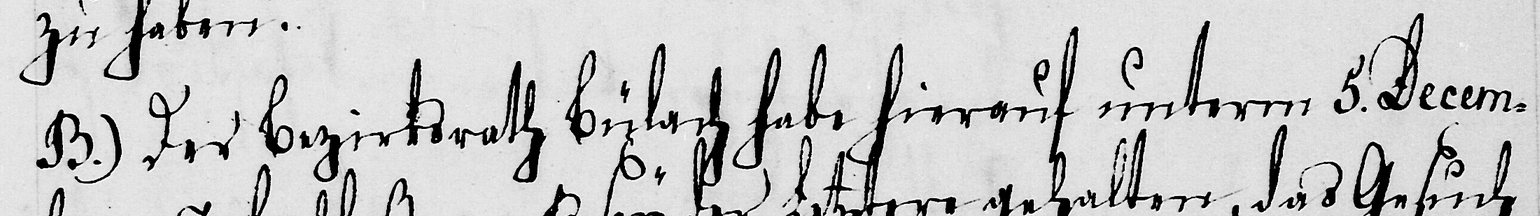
B.) Der Bezirksrath Bülach habe hierauf unterm 5. Decemb¬
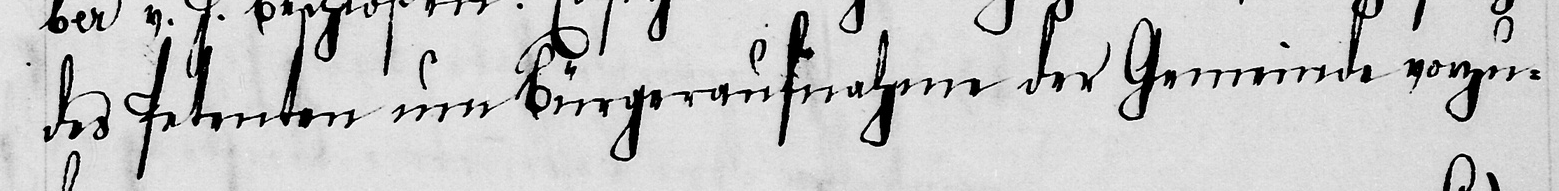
des Petenten um Bürgeraufnahme der Gemeinde vorzu¬
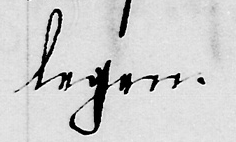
legen.
